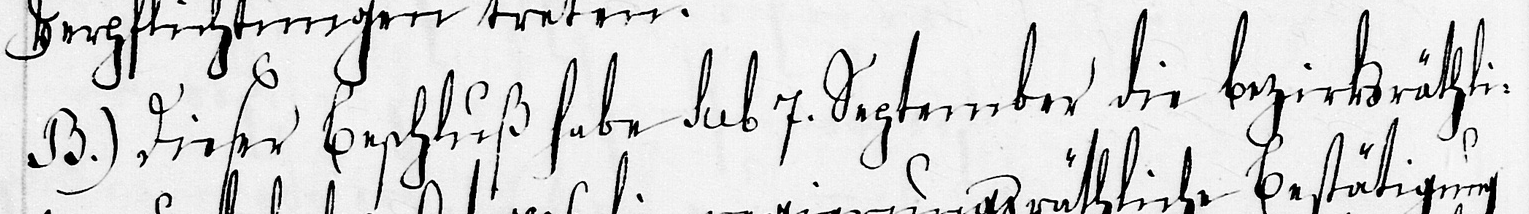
B.) Dieser Beschluß habe sub 7. September die bezirksräthli¬
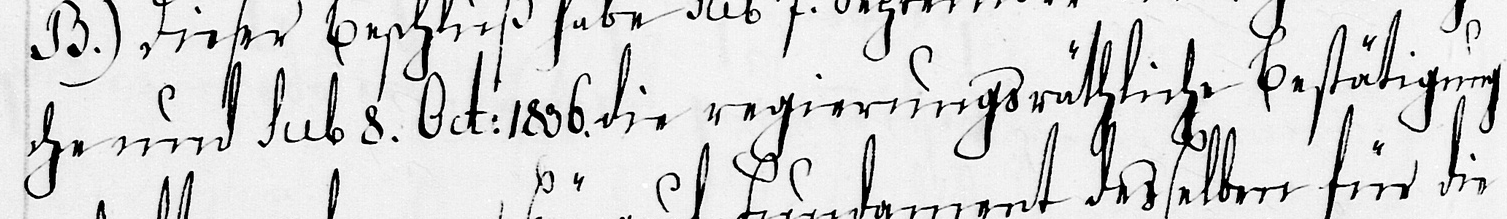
che und sub 8. Oct: 1836. die regierungsräthliche Bestätigung
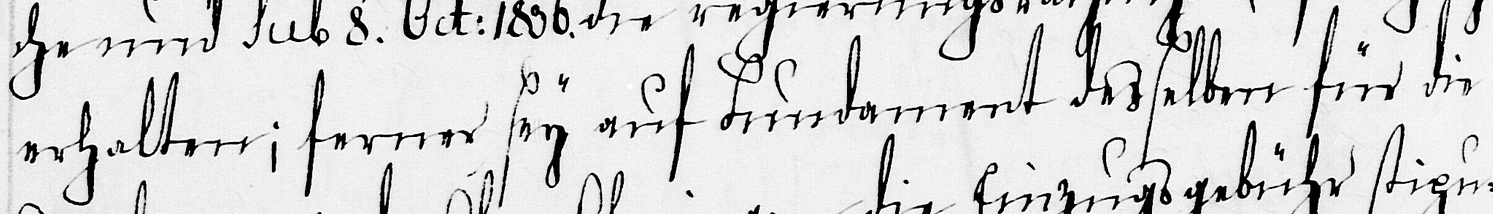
erhalten; ferner sey auf Fundament desselben für die
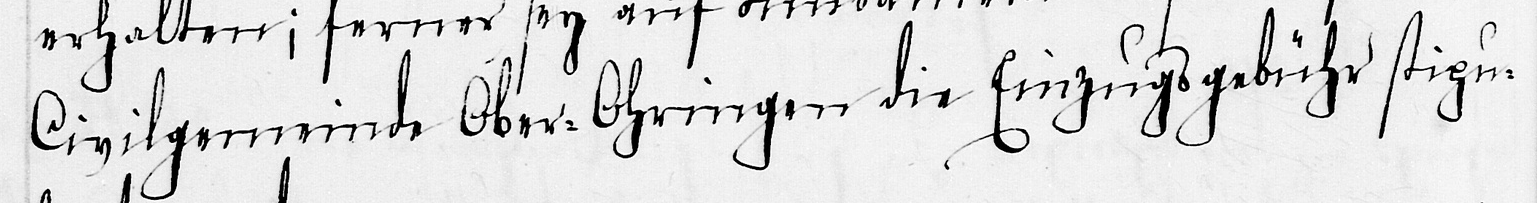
Civilgemeinde Ober-Ohringen die Einzugsgebühr stipu¬
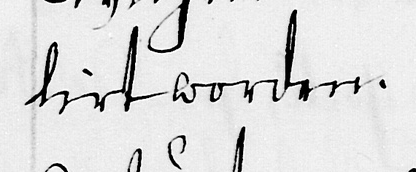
lirt worden.
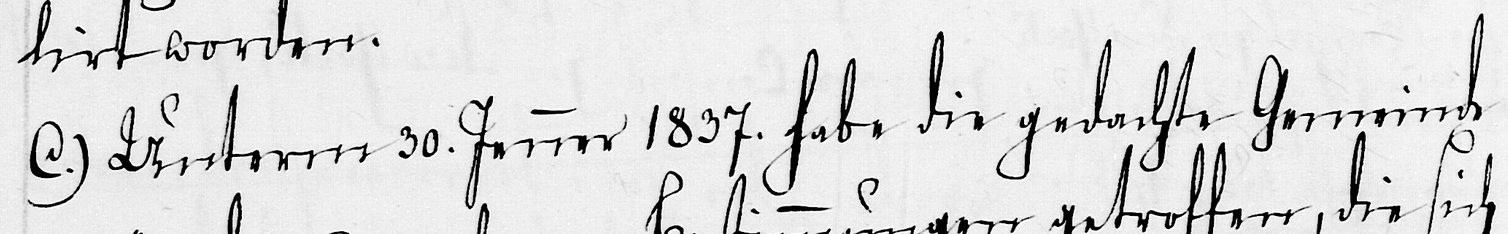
C.) Unterm 30. Jenner 1837. habe die gedachte Gemeinde
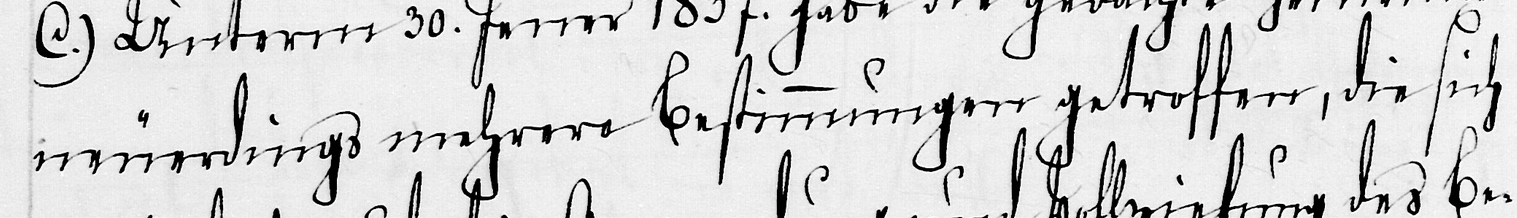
neuerdings mehrere Bestimmungen getroffen, die sich
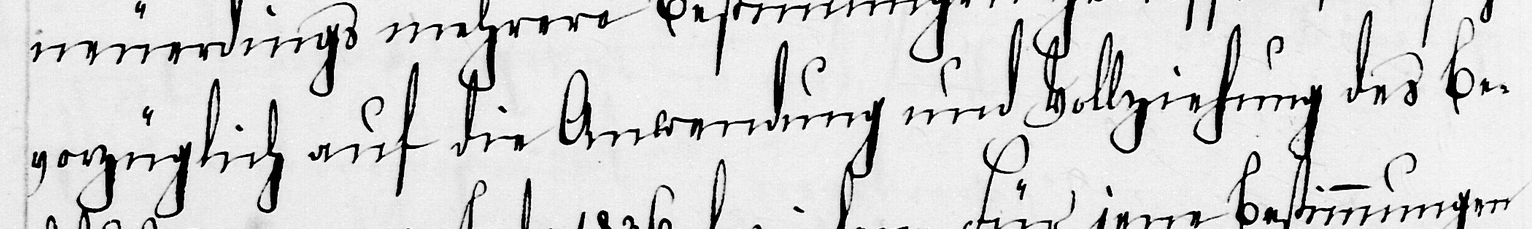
vorzüglich auf die Anwendung und Vollziehung des Be¬
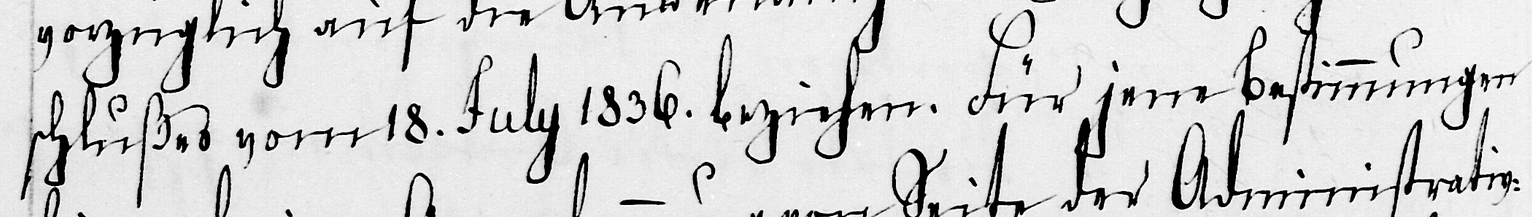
schlußes vom 18. July 1836. beziehen. Für jene Bestimmungen
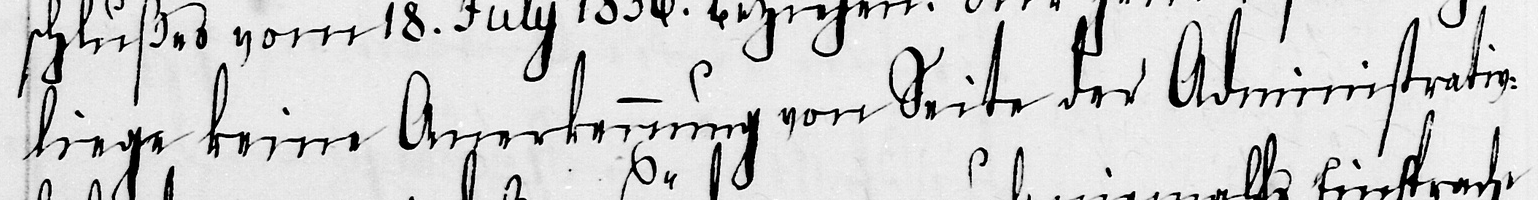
liege keine Anerkennung von Seite der Administrati¬
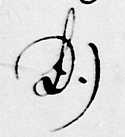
ß.
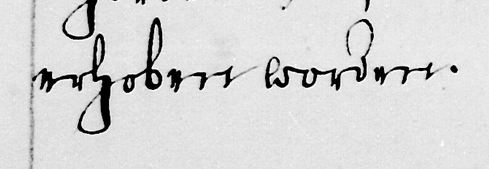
erhoben worden.
